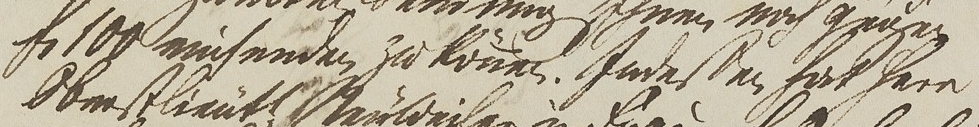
f. 100 einsenden zu können. Indessen hat Herr
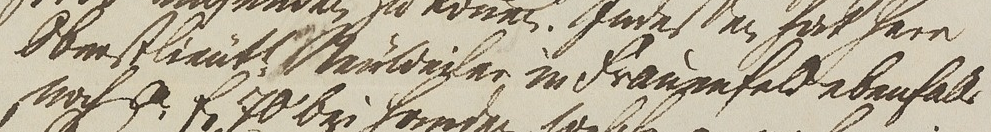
OberstlieuttNeuweiler in Frauenfeld ebenfalls
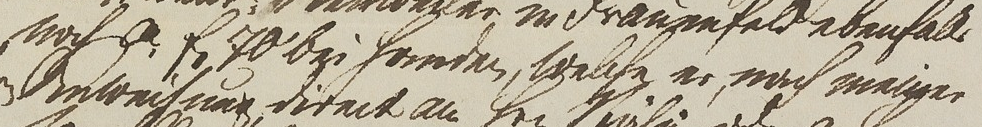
noch ca f. 70 bei Handen, welche er nach meiner
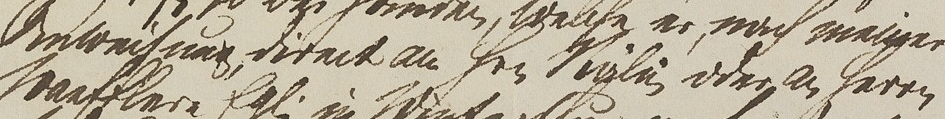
Anweisung direct an Hrn Kälin oder an Herrn
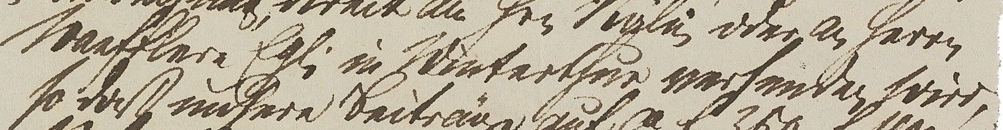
Waeffler-Egli in Winterthur versenden wird,
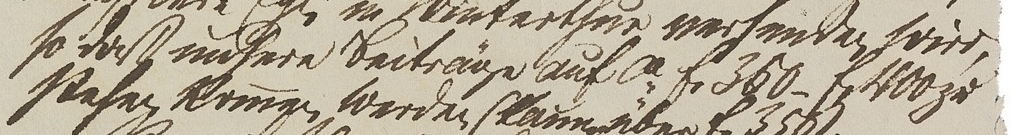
so daß unsere Beiträge auf ca. f. 350 – f. 400 zu
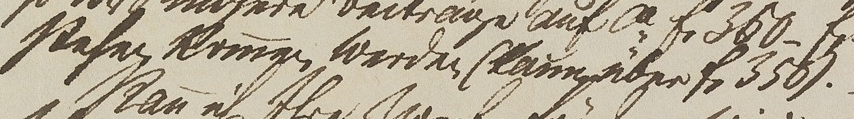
stehen kommen werden (kaum über f. 350). –
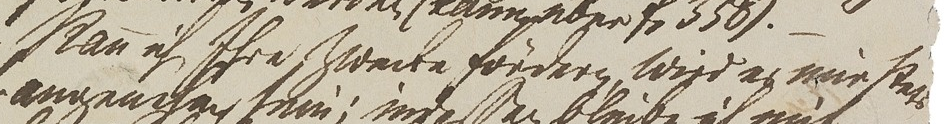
Kann ich Ihre Zwecke fördere, wird es mir stets
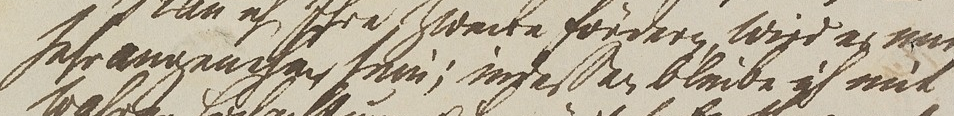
sehr angenehm sein; indessen bleibe ich mit
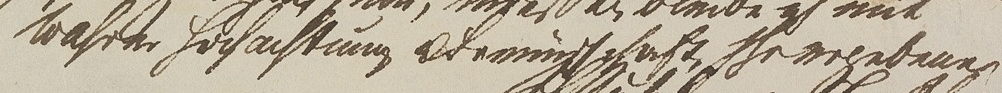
wahrer Hochachtung & Freundschaft, Ihr ergebener
